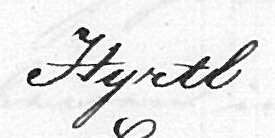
Hyrtl
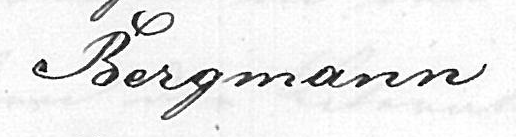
Bergmann
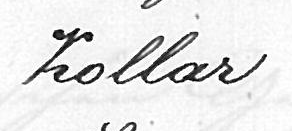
Kollar
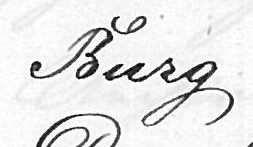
Burg
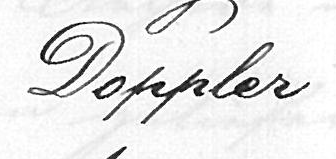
Doppler
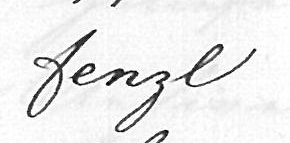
Fenzl
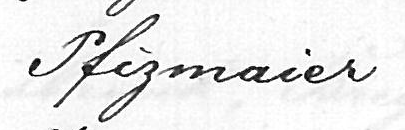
Pfizmaier
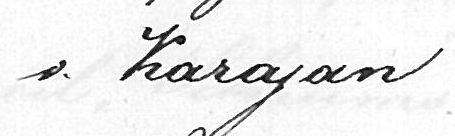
v. Karajan
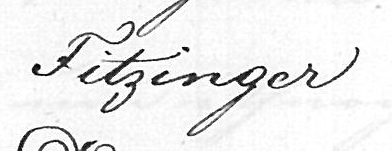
Fitzinger
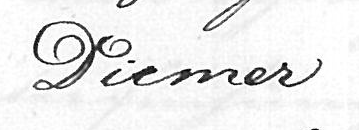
Diemer
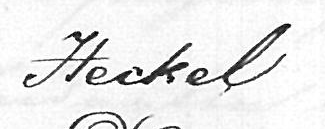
Heckel
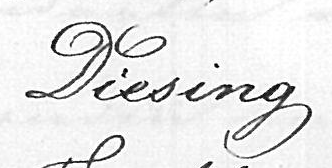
Diesing
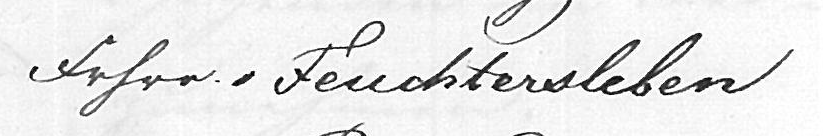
Frhrr. v. Feuchtersleben
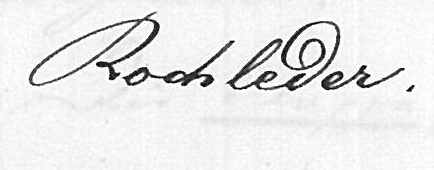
Rochleder.
